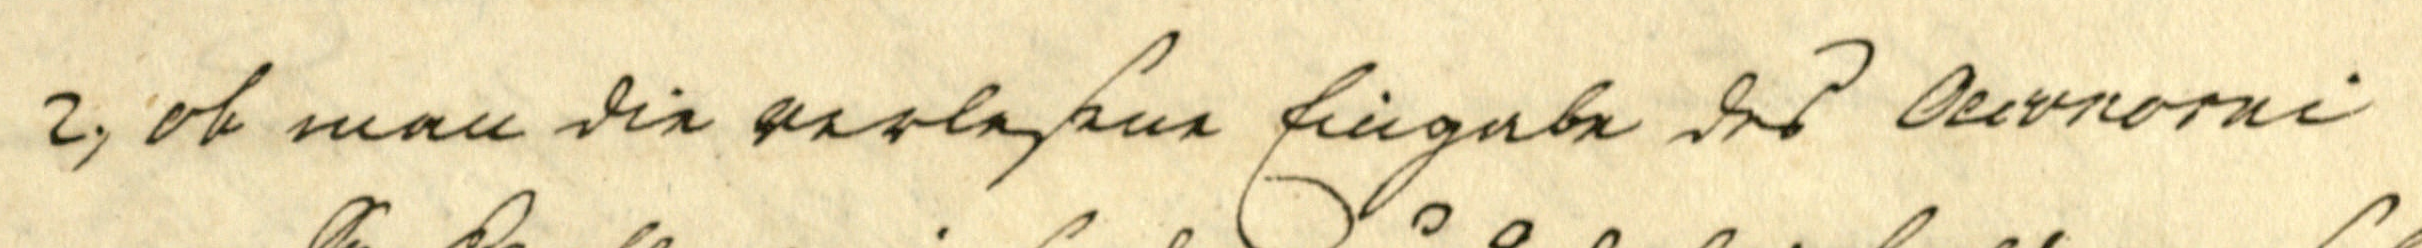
2., ob man die verlesene Eingabe des Oeconomi
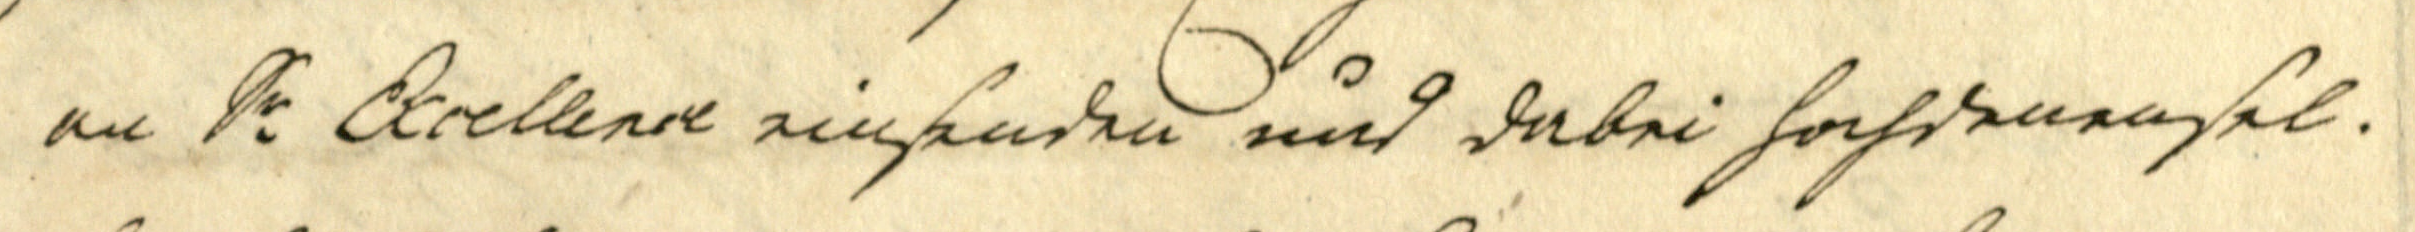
an Sr Excellence einsenden und dabei Hochdenensel¬
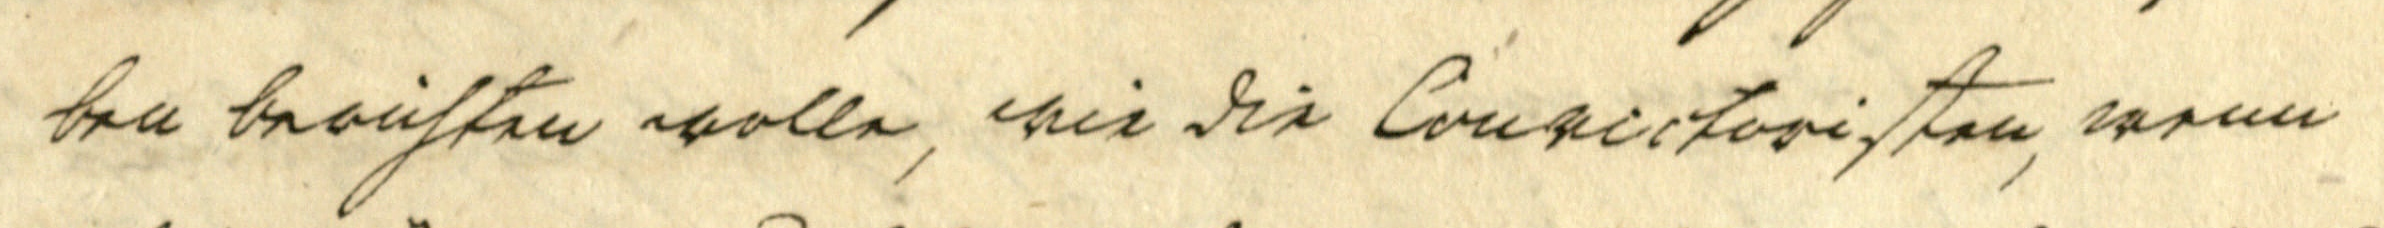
ben berichten wolle, wie die Convictoristen, wenn
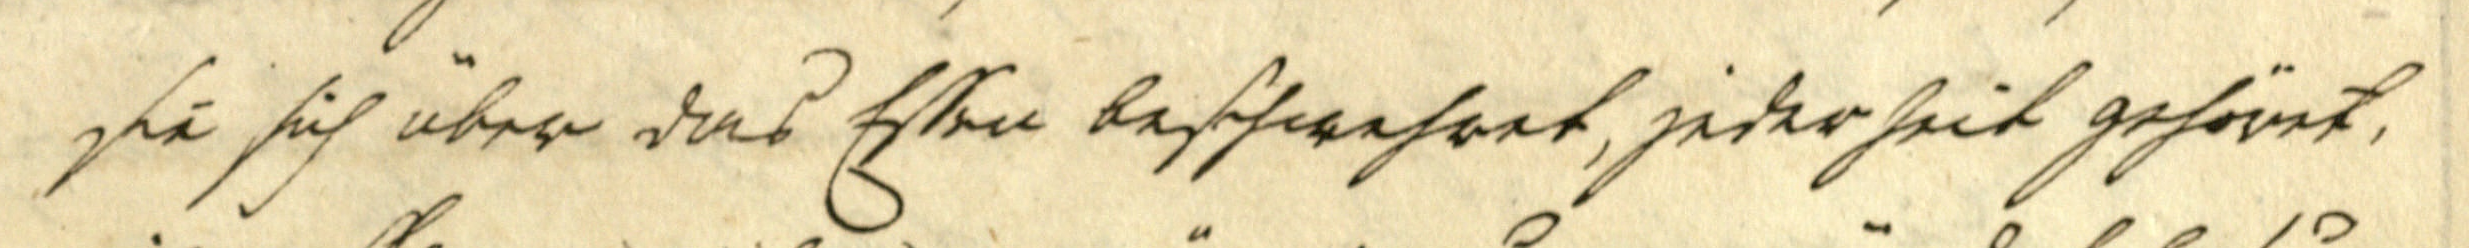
sie sich über das Essen beschwehret, jeder Zeit gehöret
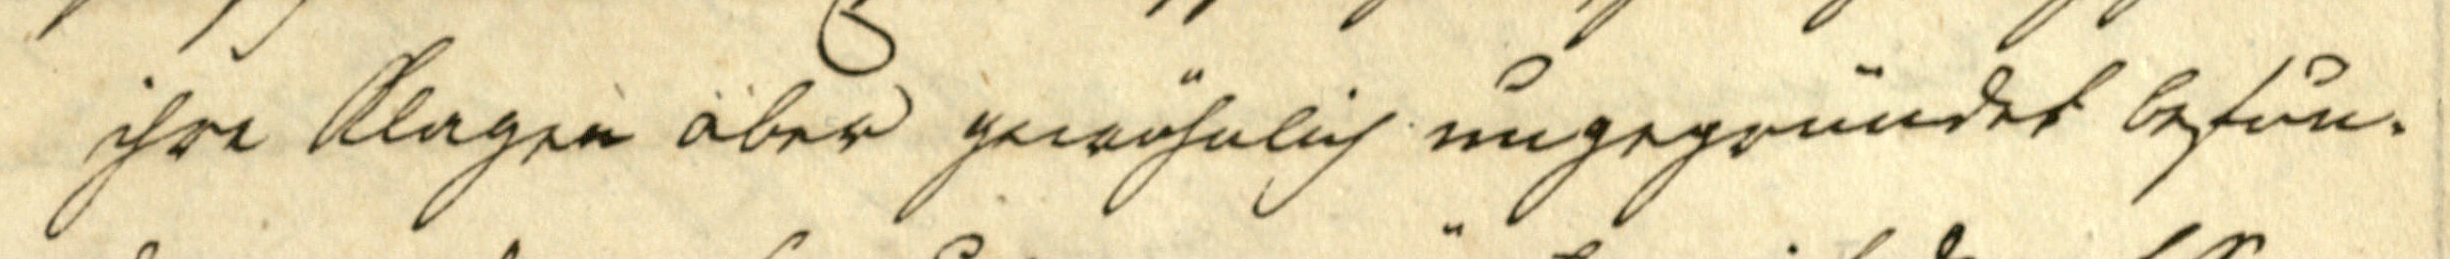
ihre Klagen aber gewöhnlich ungegründet befun-
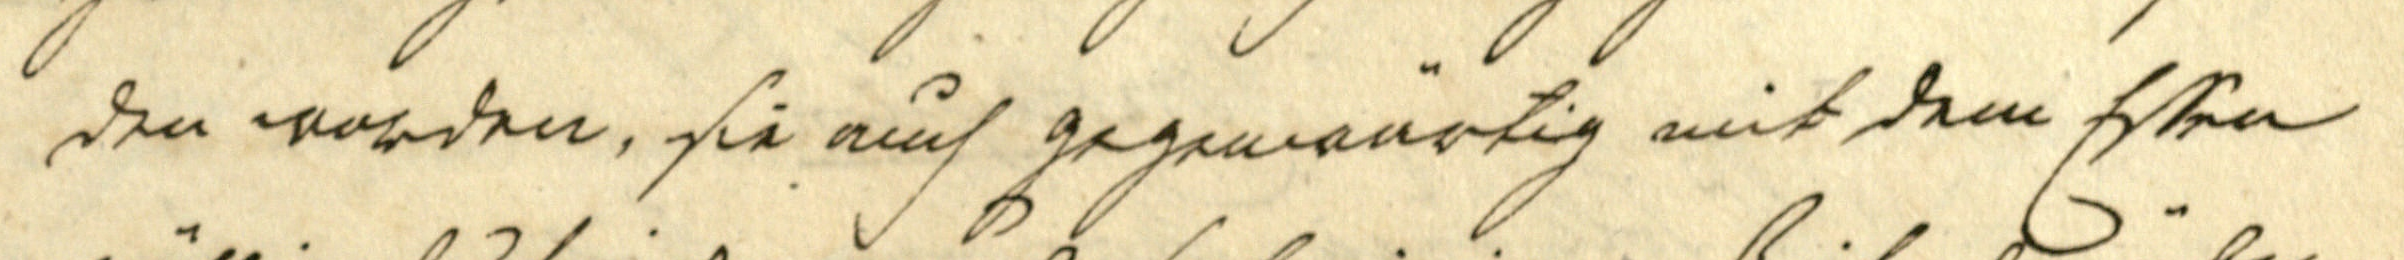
den worden, sie auch gegenwärtig mit dem Essen
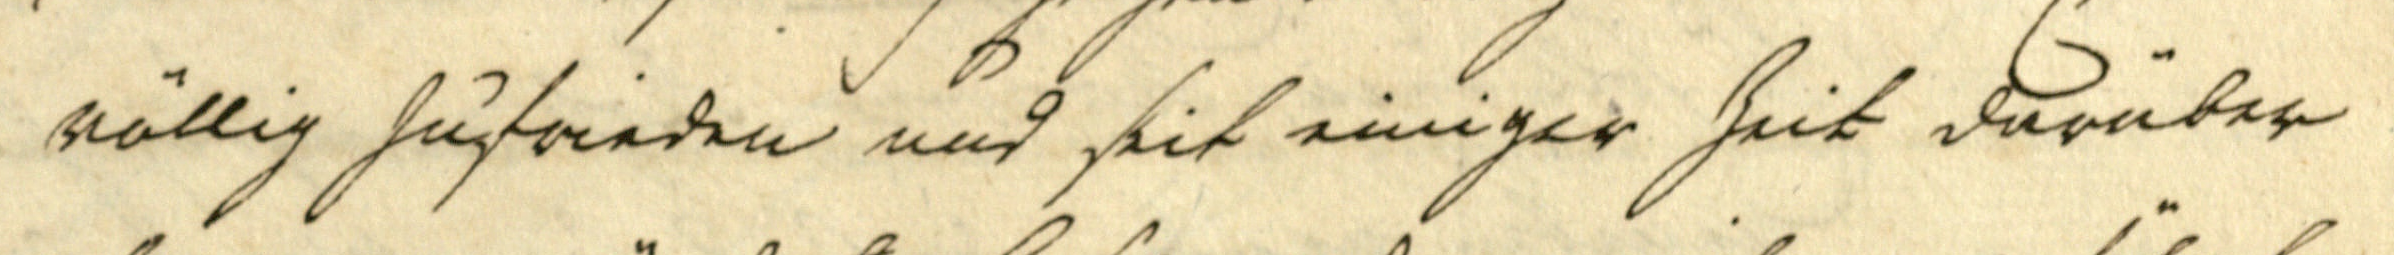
völlig zufrieden und seit einer Zeit darüber
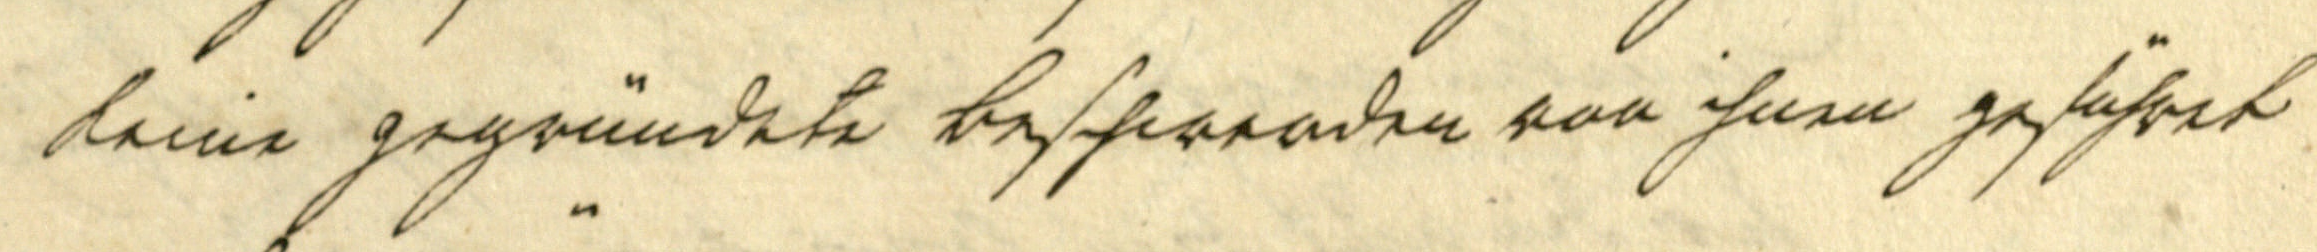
keine gegründete Beschwerden von ihnen geführet
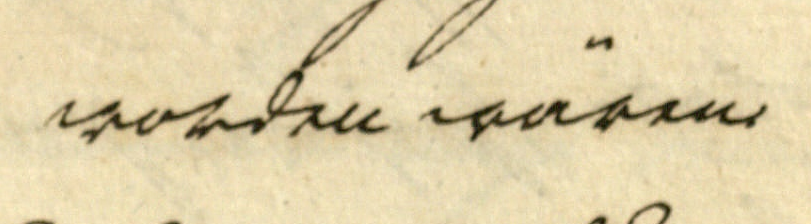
worden wären.
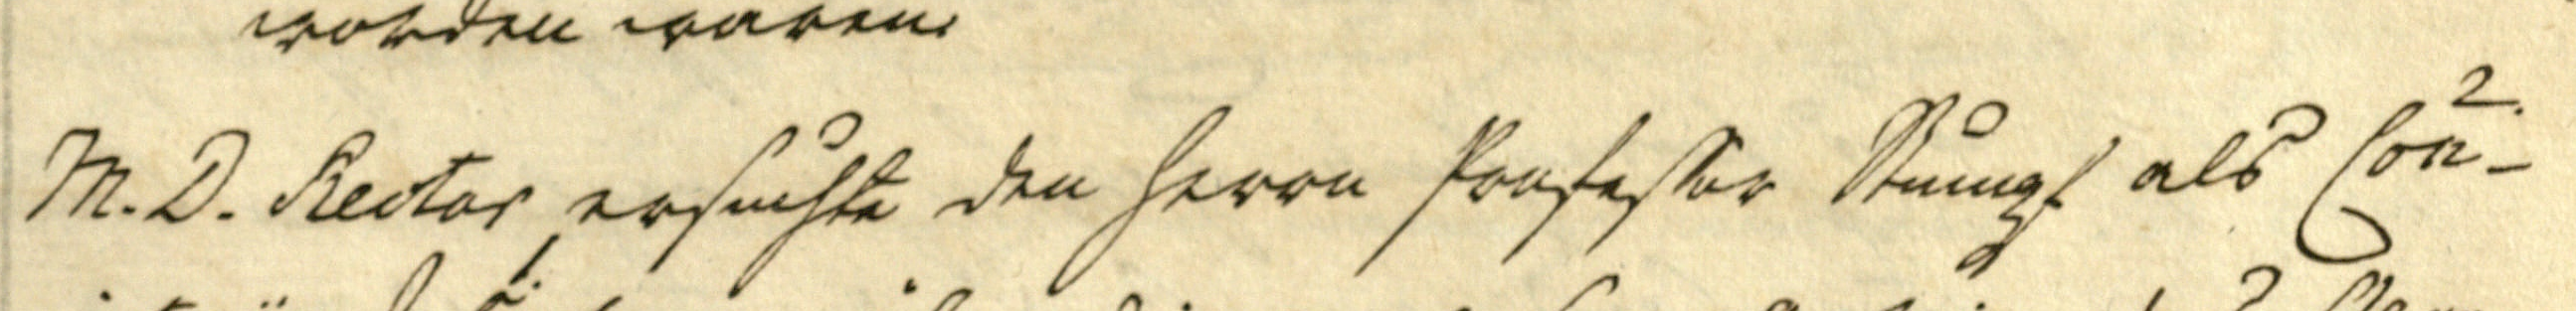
M. D. Rector ersuchte den Herrn Professor Stumpf als Con¬
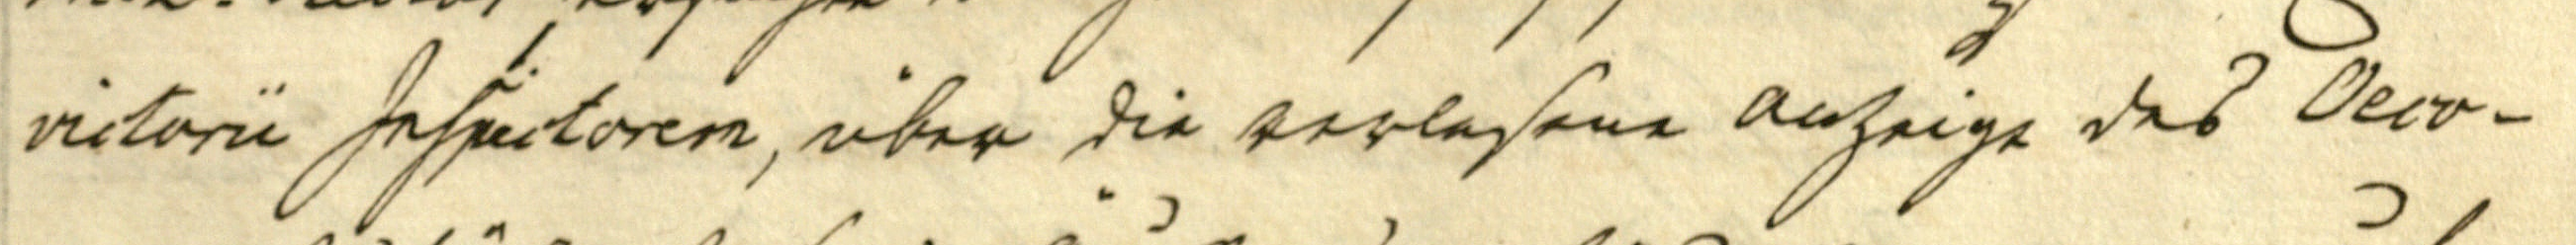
victorii Inspectorem, über die verlesene Anzeige des Oeco¬
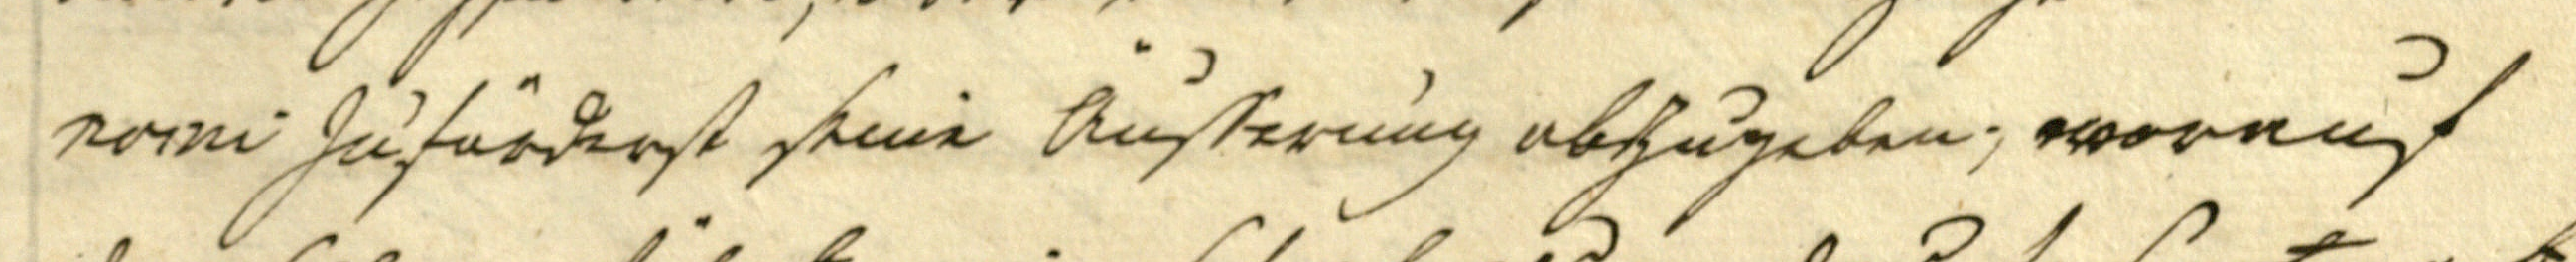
nomi zuförderst seine Äusserung abzugeben, worauf
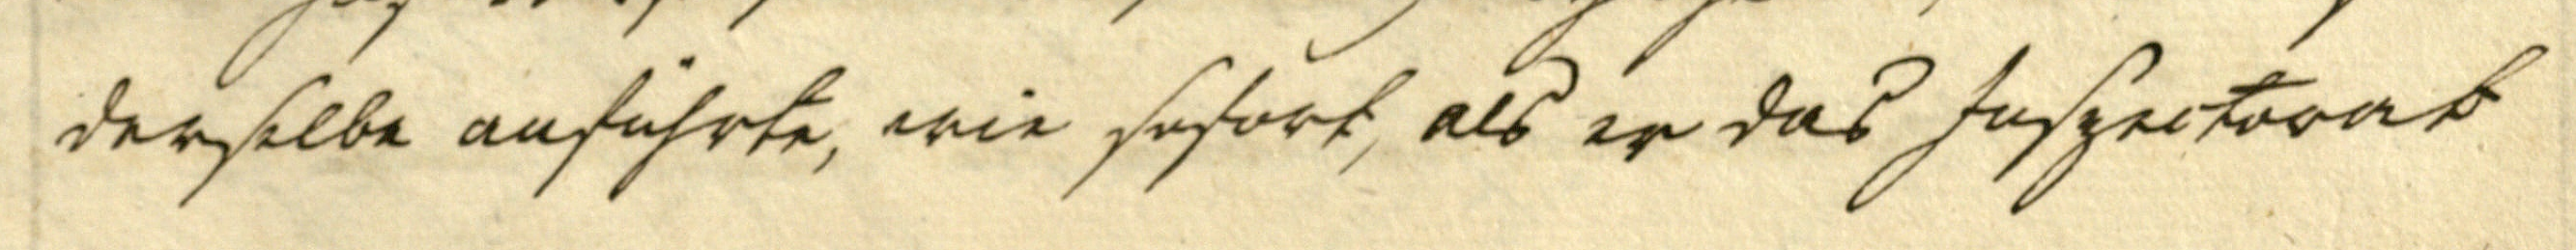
derselbe anführte, wie sofort, als er das Inspectorat
